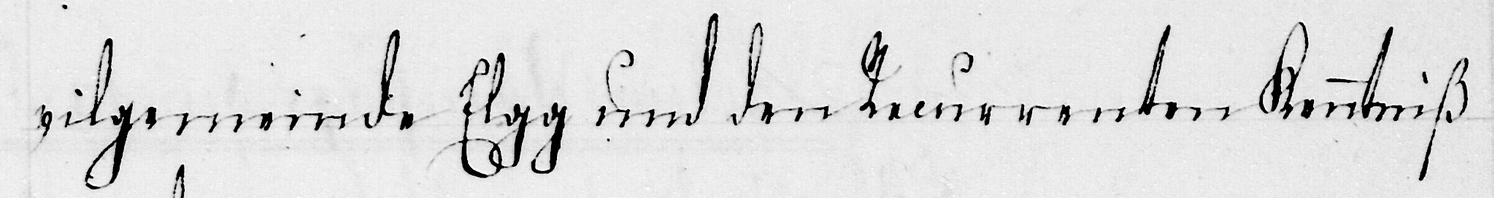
vilgemeinde Elgg und den Recurrenten Kenntniß
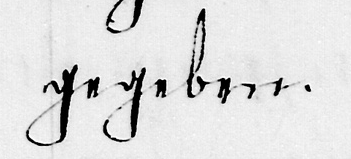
gegeben.
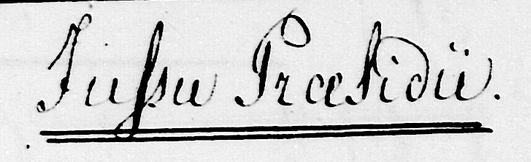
Iussu Præsidii.
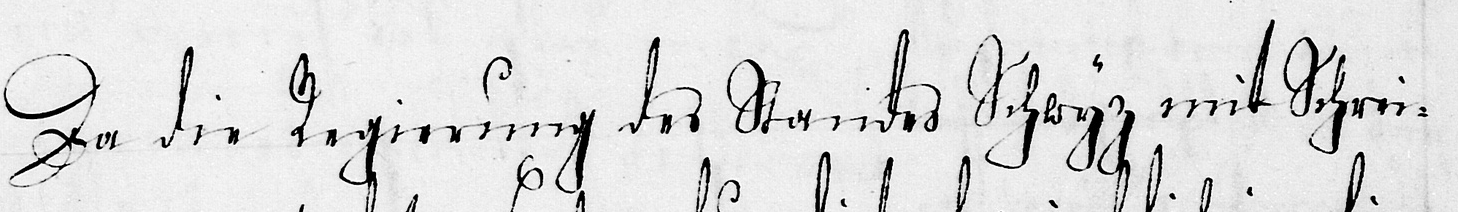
Da die Regierung des Standes Schwyz mit Schrei¬
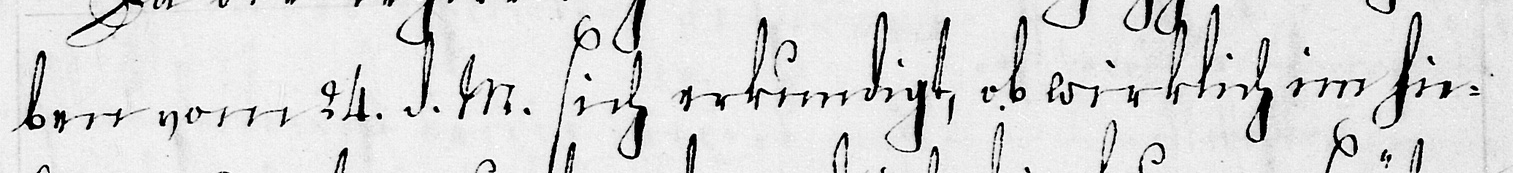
ben vom 24. d. M. sich erkundigt, ob wirklich im hie¬
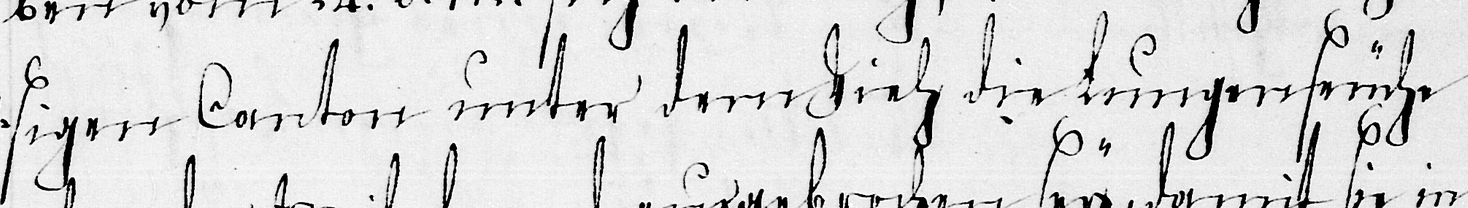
sigen Canton unter dem Vieh die Lungenseuche
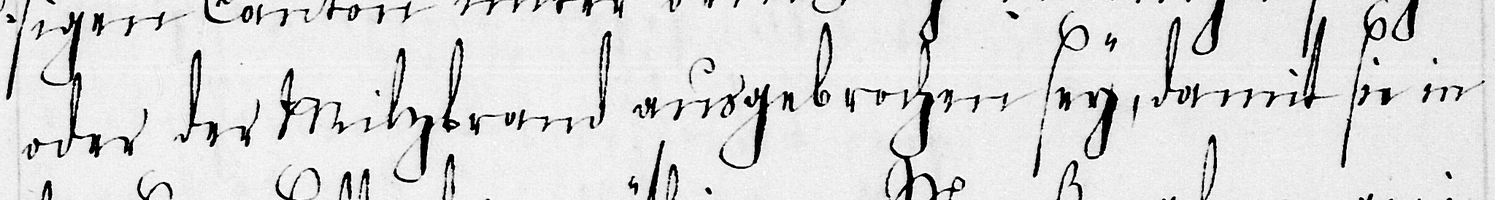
oder der Milzbrand ausgebrochen sey, damit sie in
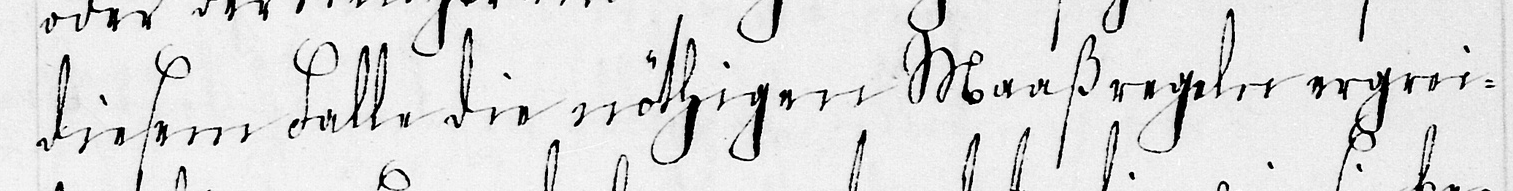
diesem Falle die nöthigen Maaßregeln ergrei¬
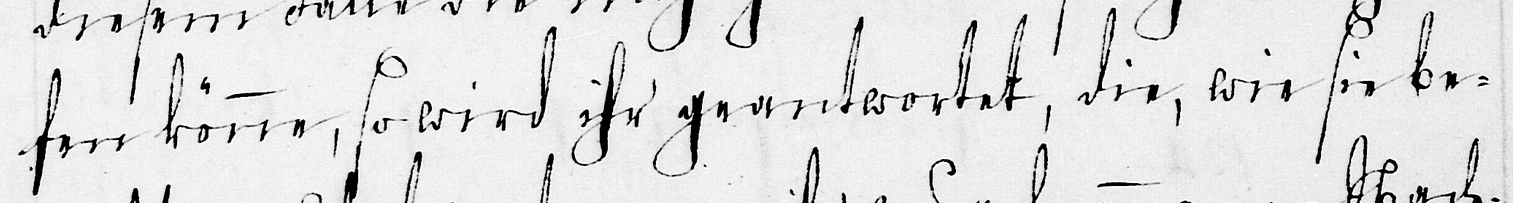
fen könne, so wird ihr geantwortet, die, wie sie be¬
